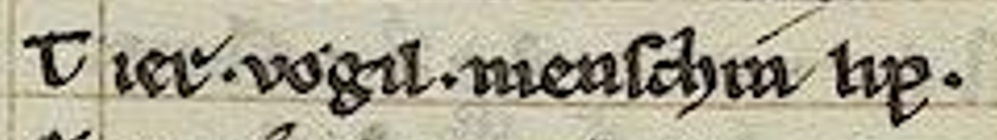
Tier. vogil. menſchin lip.
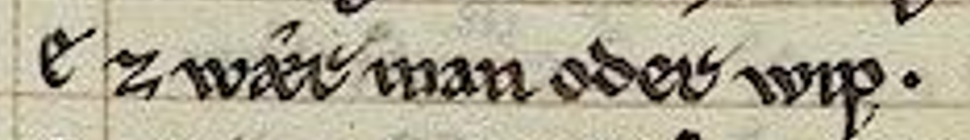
Ez w[ae]r man oder wip.
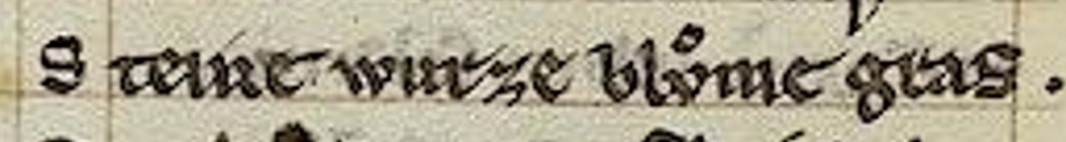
Steine wurze blv°ome gras.
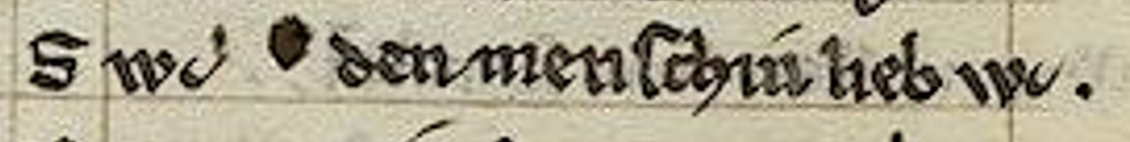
Sw(az) den menſchin lieb w(az).
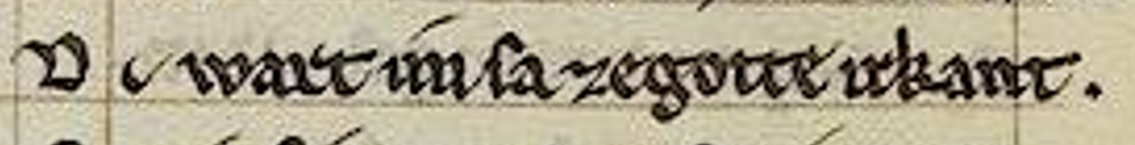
D(az) wart im ſa zegotte irkant.
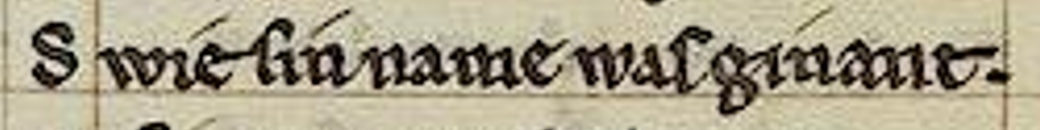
Swie ſin name waſ ginant.
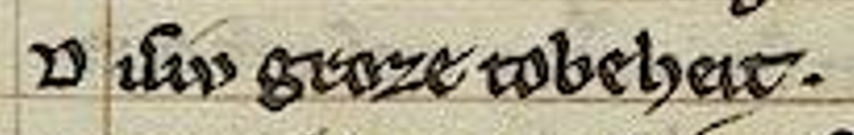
Diſiv groze tobeheit.
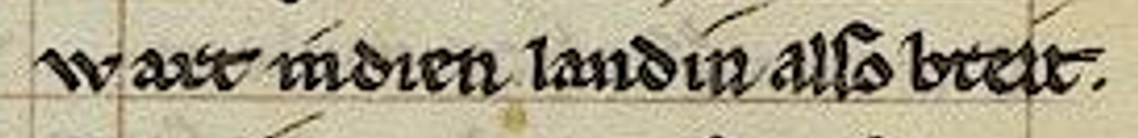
Wart indien landin alſo breit.
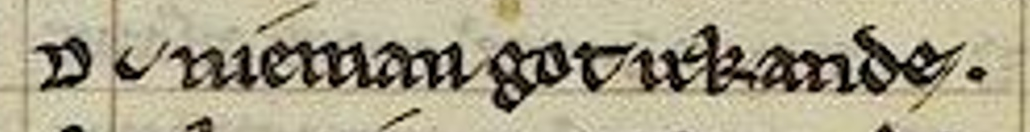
D(az) nieman got irkande.
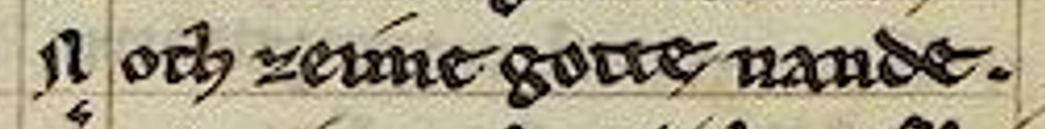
Noch zeime gotte nande.
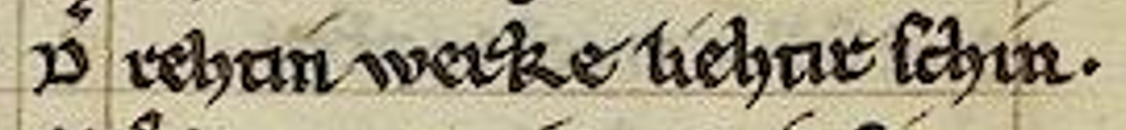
D(er) rehtin werke liehtir ſchin.
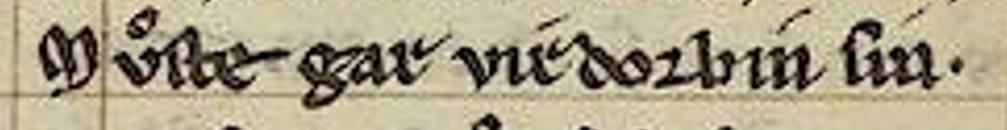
Mv°oſte gar vir dorbin ſin.
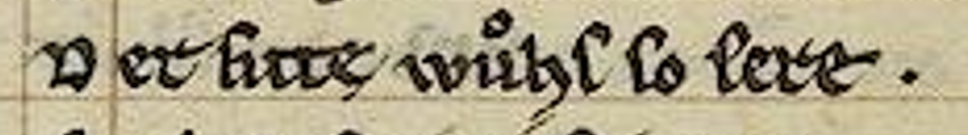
Der ſitte wu°ohſ ſo ſere.
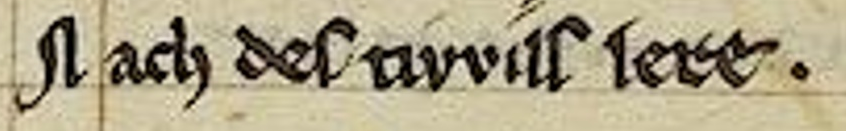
Nach deſ tivvilſ lere.
